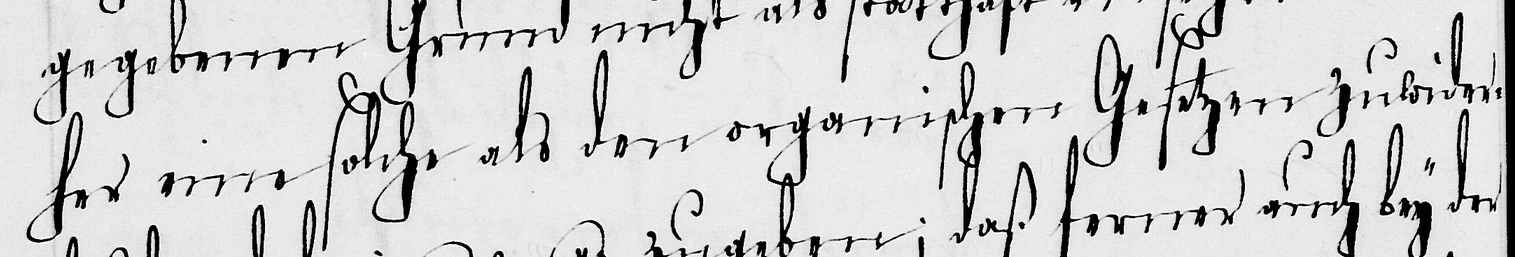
her eine solche als den organischen Gesetzen zuwide¬
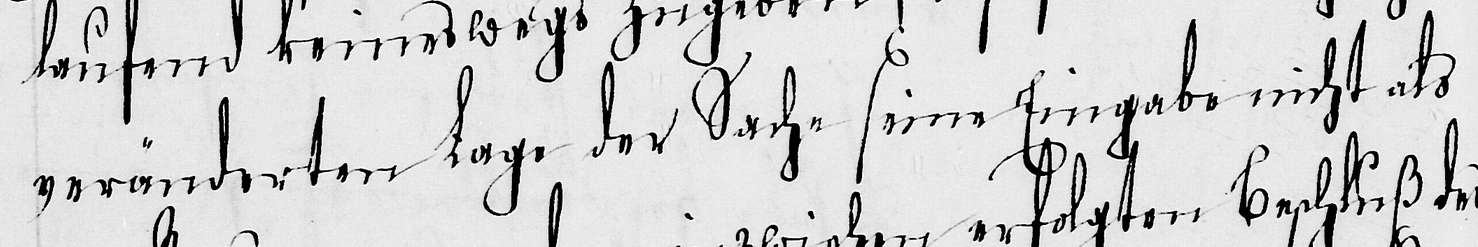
veränderten Lage der Sache seine Eingabe nicht als
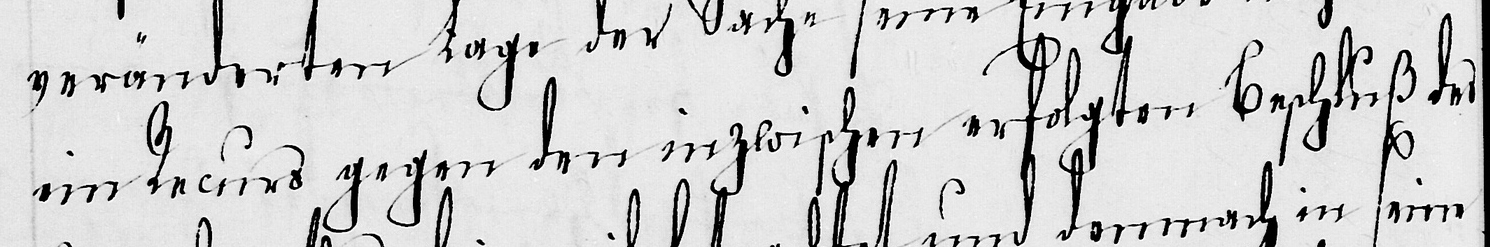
ein Recurs gegen den inzwischen erfolgten Beschluß des
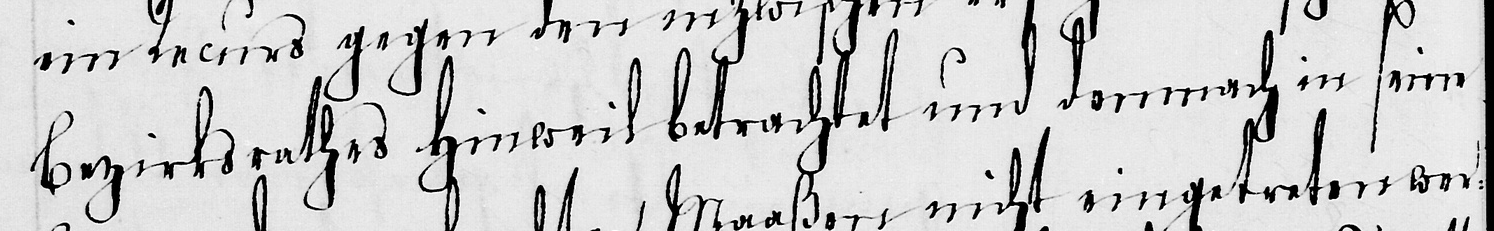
Bezirksrathes Hinweil betrachtet und demnach in seine
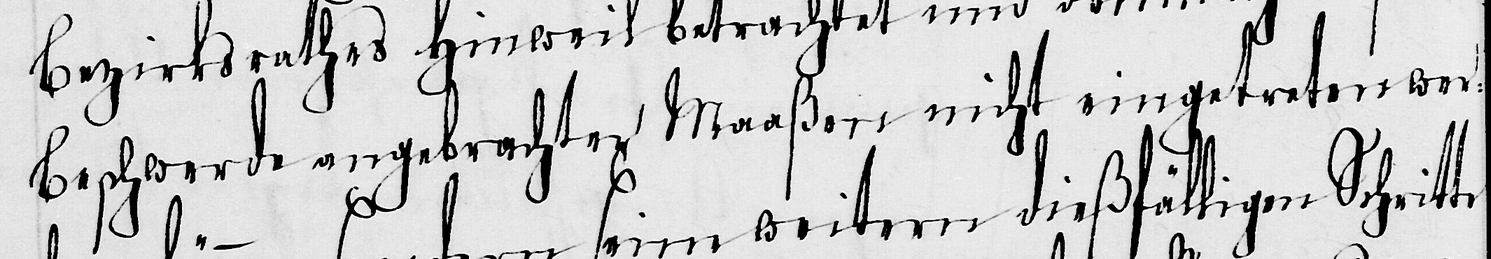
Beschwerde angebrachter Maaßen nicht eingetreten wer¬
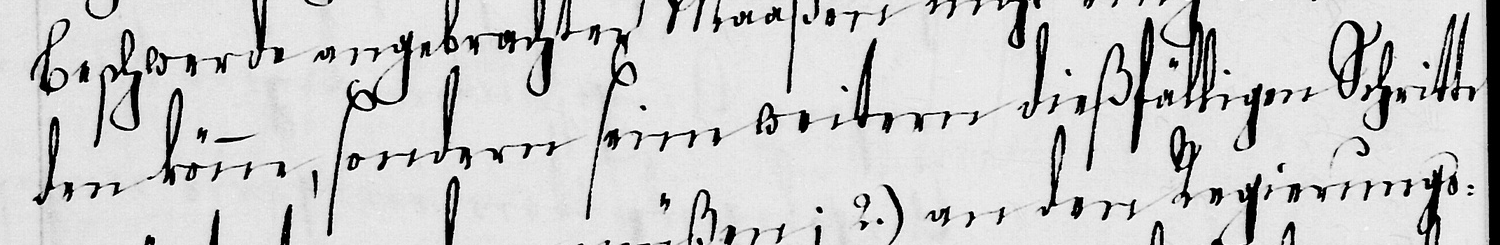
den könne, sondern seine weitern dießfälligen Schrit¬
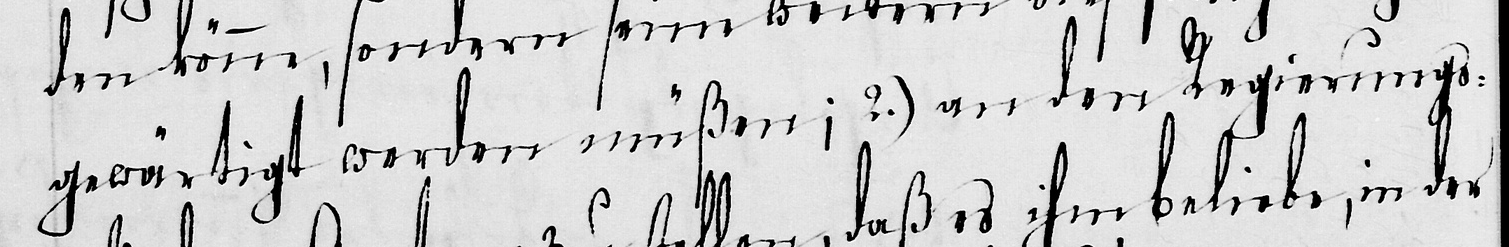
gewärtigt werden müßen; 2.) an den Regierungs¬
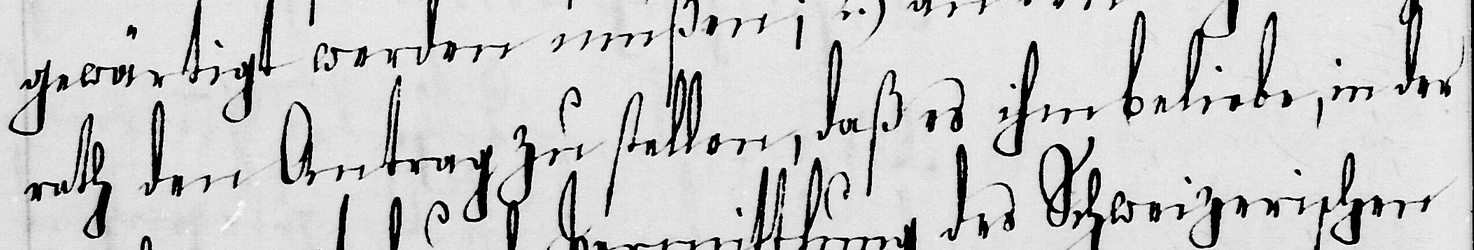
rath den Antrag zu stellen, daß es ihm beliebe, in der
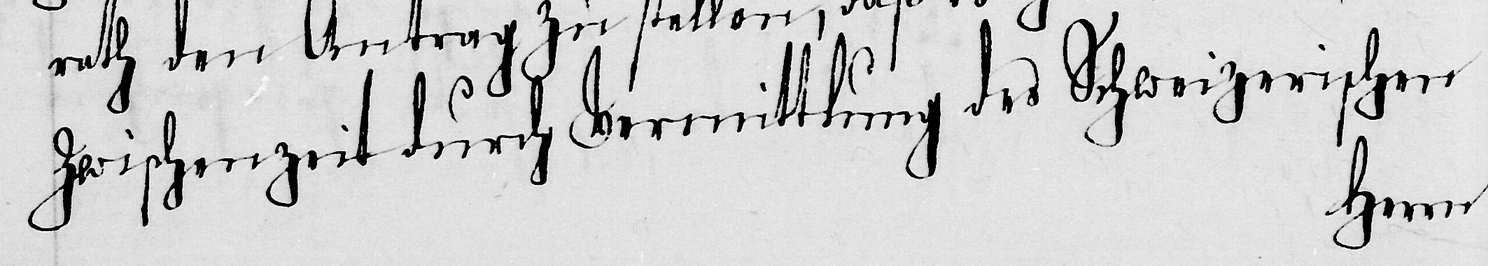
Zwischenzeit durch Vermittlung des Schweizerischen
